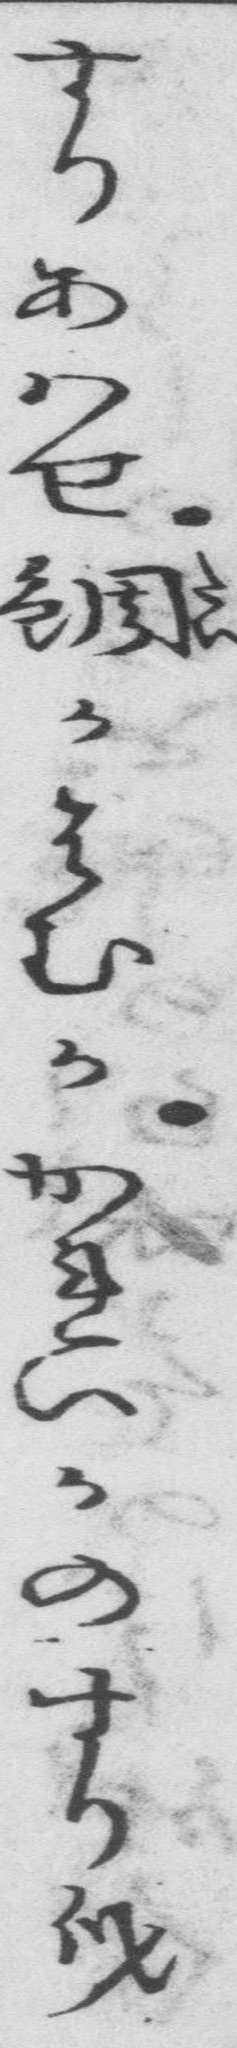すりあはせ。鯛かはむか。かれいかのすり身
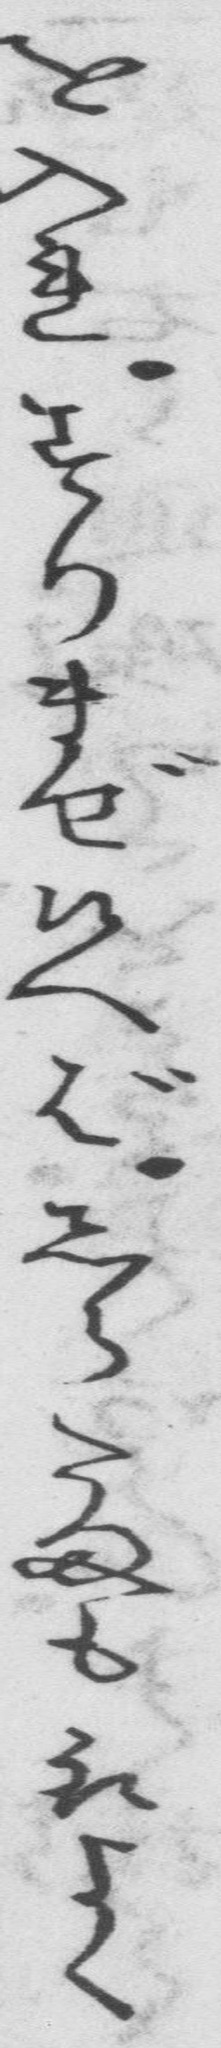を入れ。すりまぜ候へば。しらたまも取よく
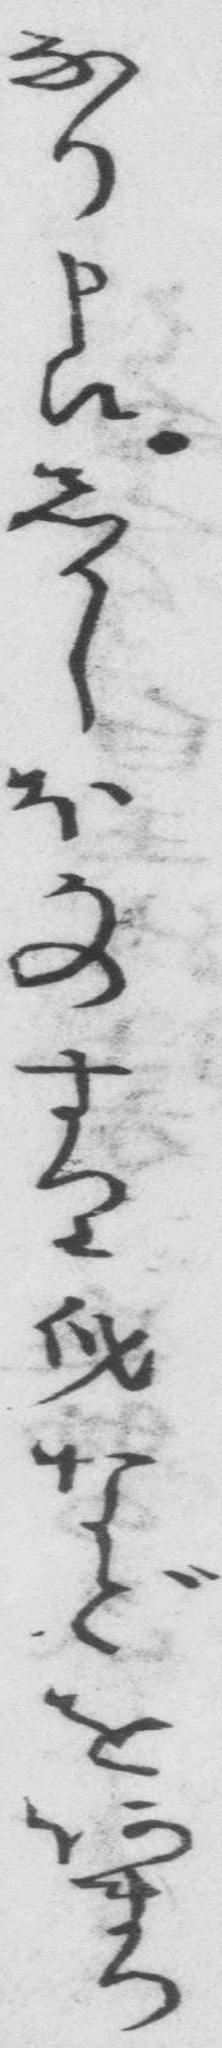なり申候。しかしほかのすり身などをあまり
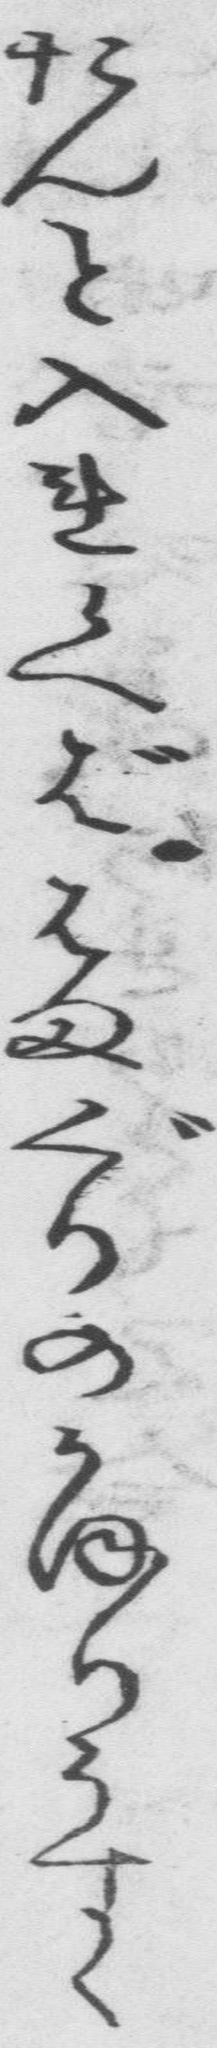たんと入れ候へば。はまぐりのかほりうすく
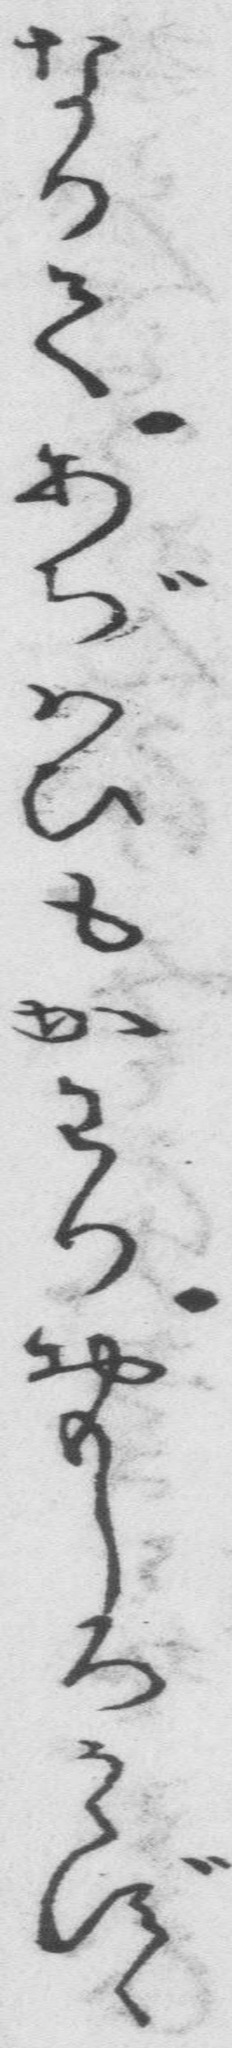なりて。あぢはひもかわり。おもしろからず候
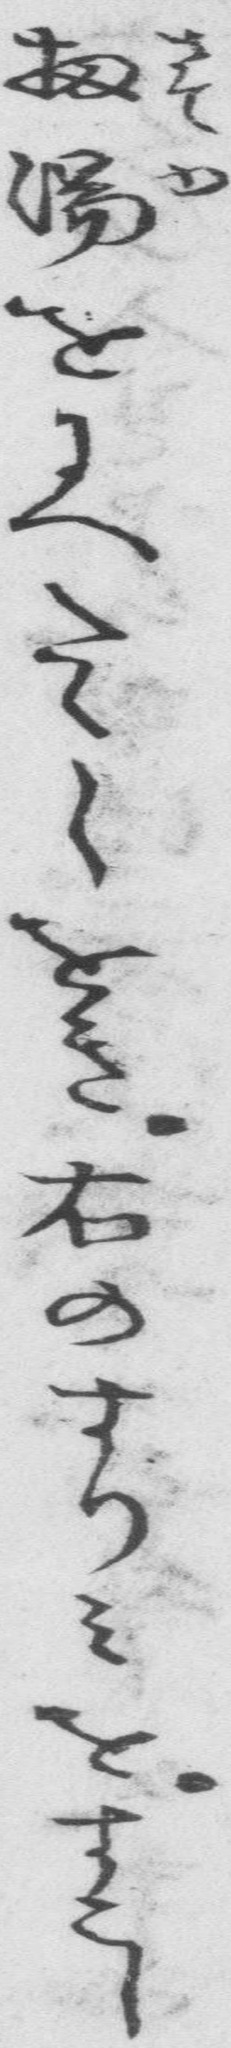扨湯をにへたゝしをき。右のすりみを。すこし
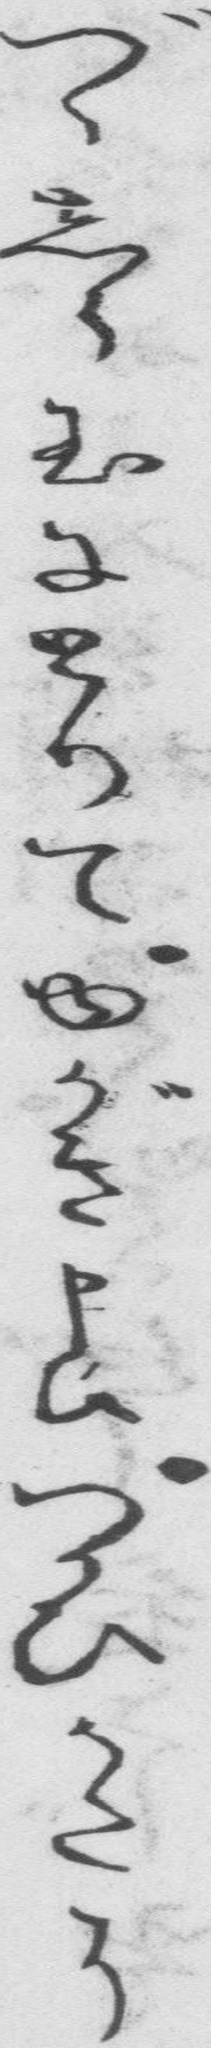づゝしら玉にとりて。ゆがき申候。つかひかたに
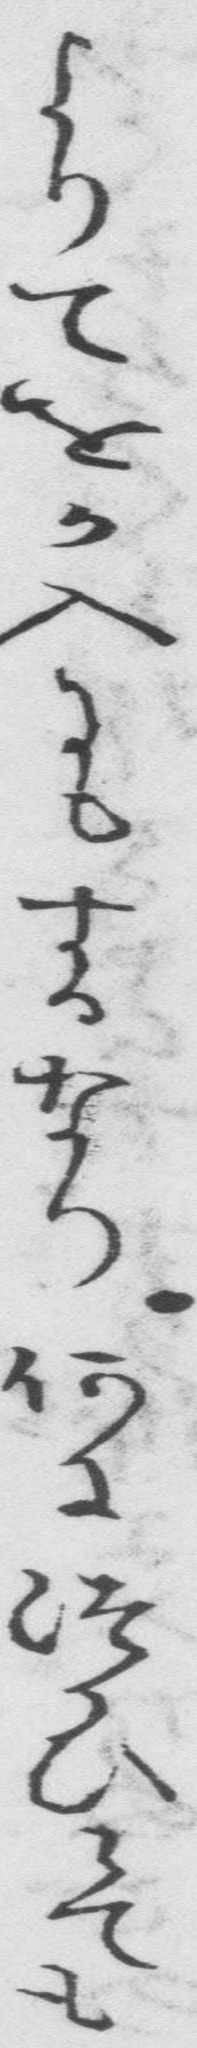よりてをか入にもするなり。何につかひ候ても
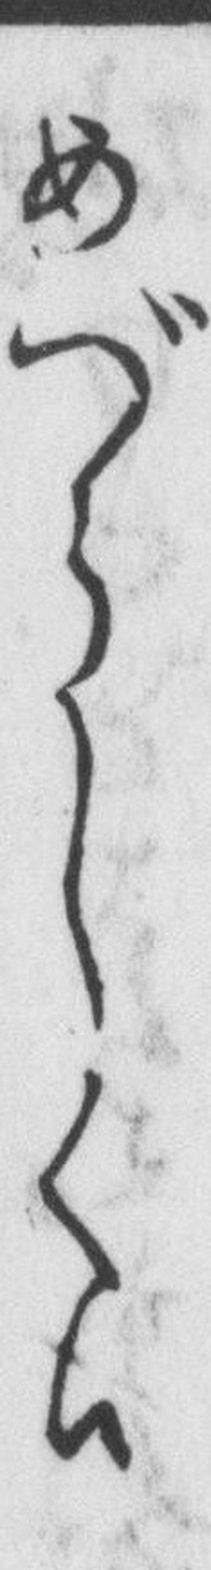めづらしく候
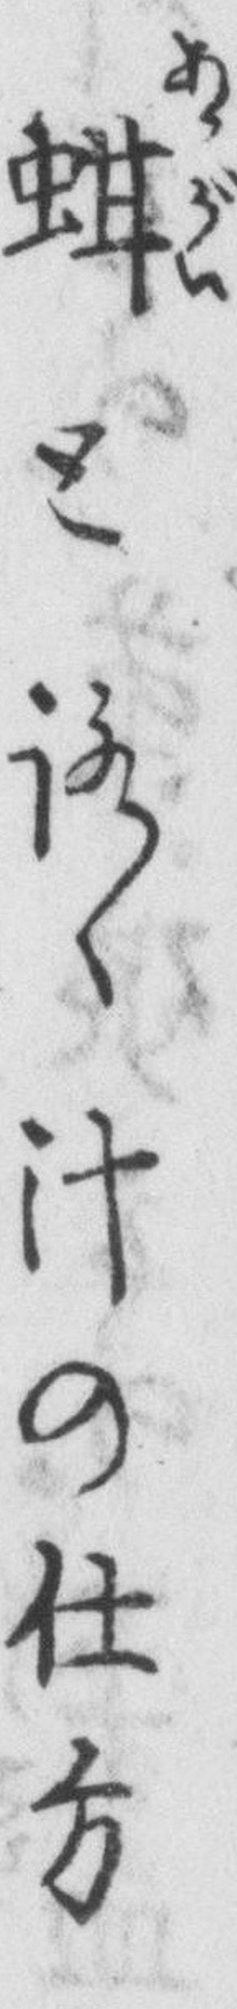蚶とろゝ汁の仕方
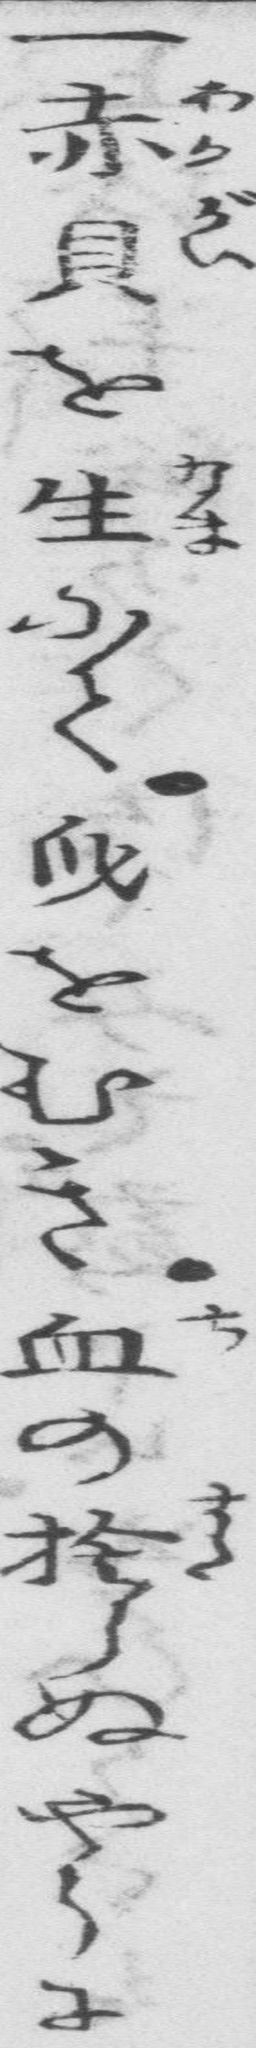一赤貝を生にて。身をむき。血の捨らぬやうに
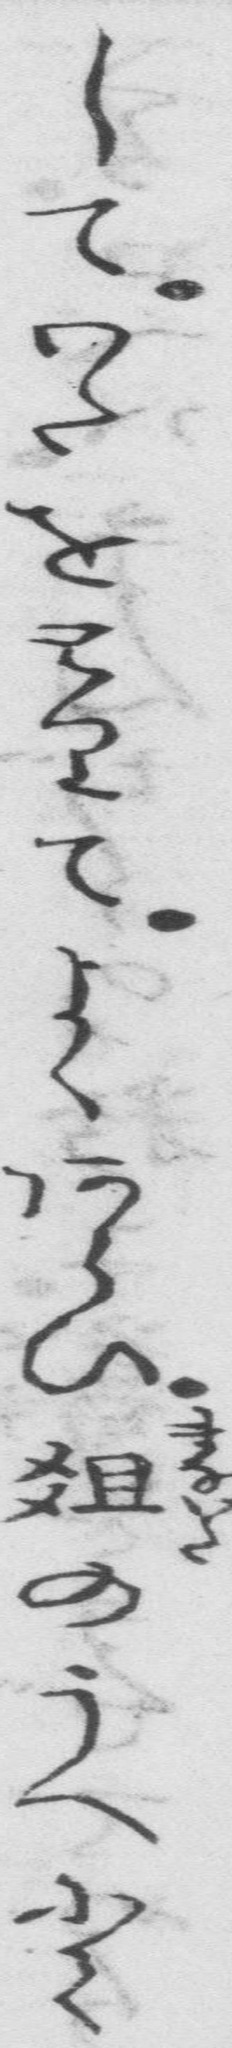して。わたをとりて。よくあらひ。俎のうへにて
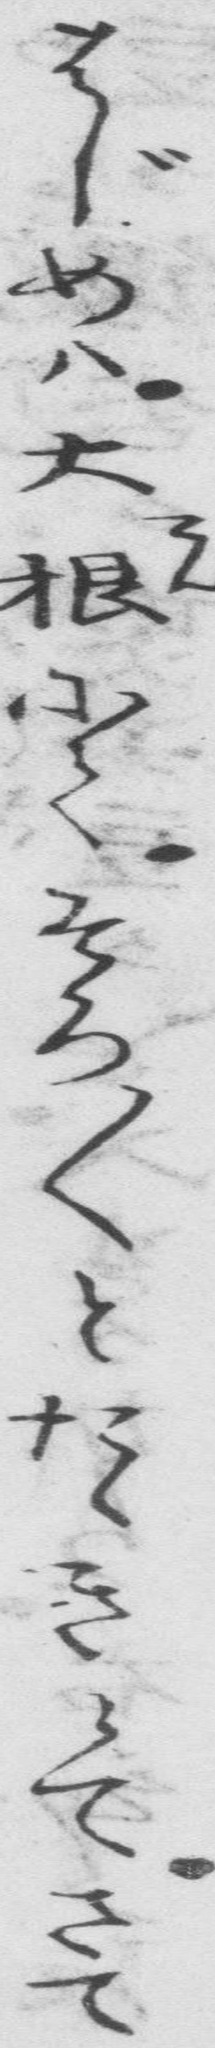はじめは。大根にて。そろ〳〵とたゝきにて。さて
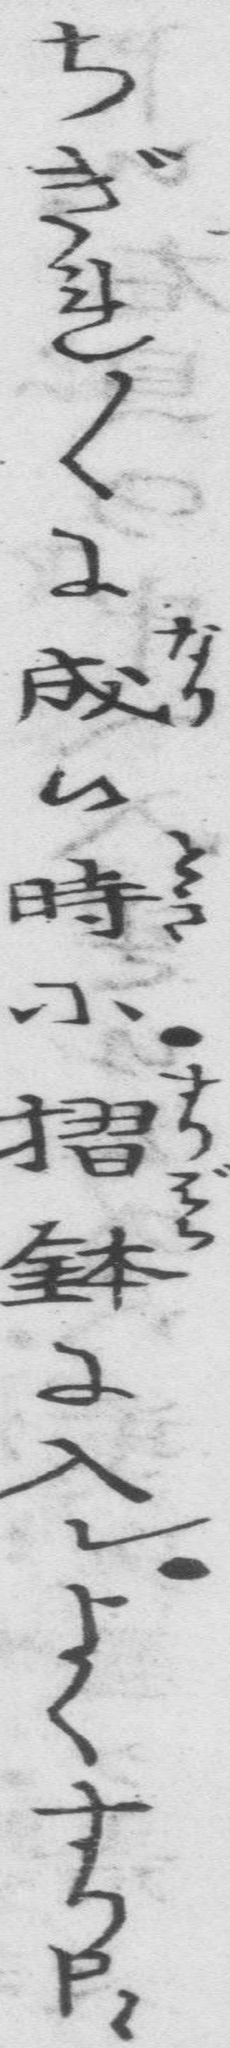ちぎれ〳〵に成候時に。摺鉢に入れ。よくすり申候
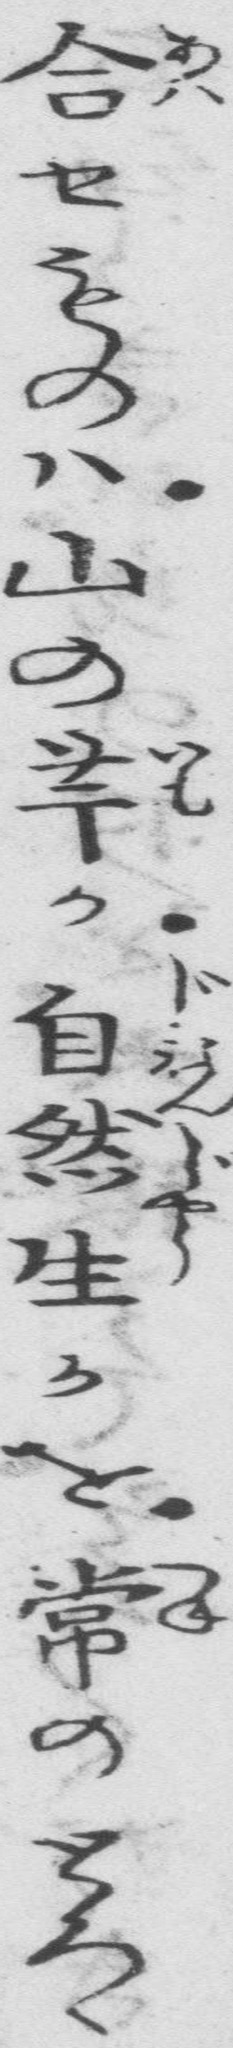合せものは。山の芋か。自然生かを。常のとろゝ
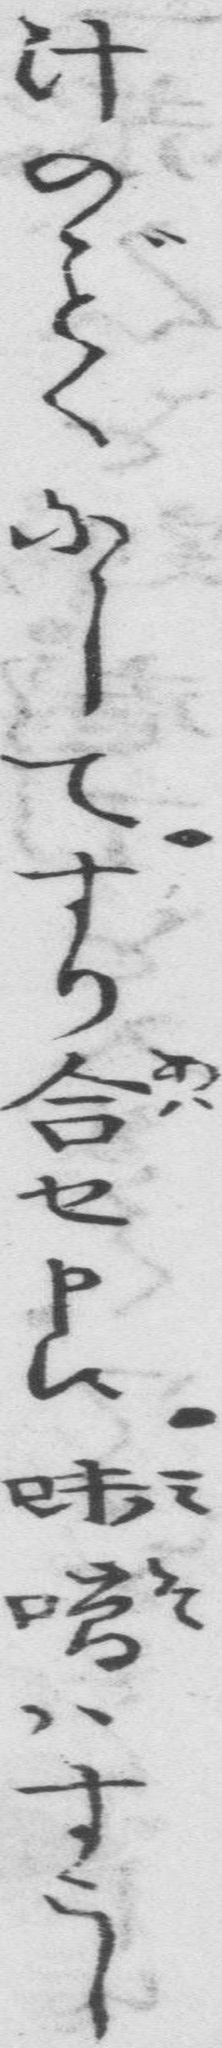汁のごとくにして。すり合せ申候。味噌はすこし
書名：萬寳料理秘密箱
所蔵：大阪府立大学学術情報センター 国文学研究資料館
